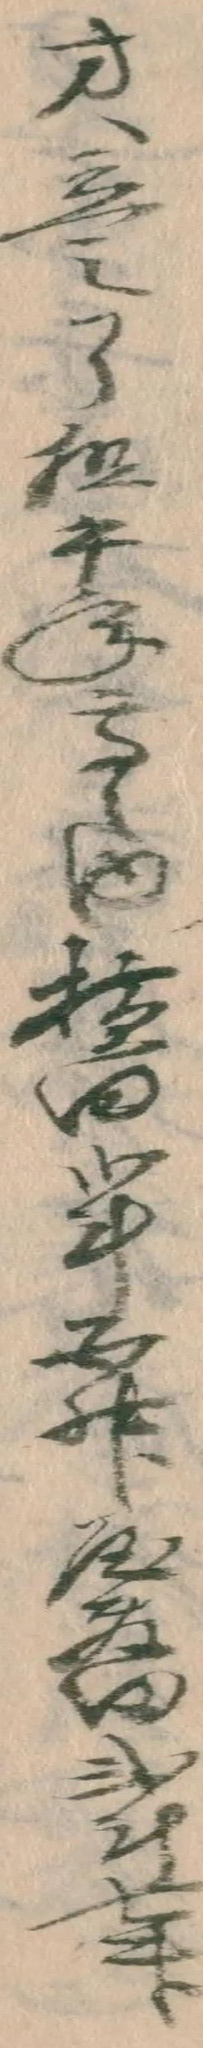方へ急之了但午年高之内横田弐斗五升屋敷切弐斗七升
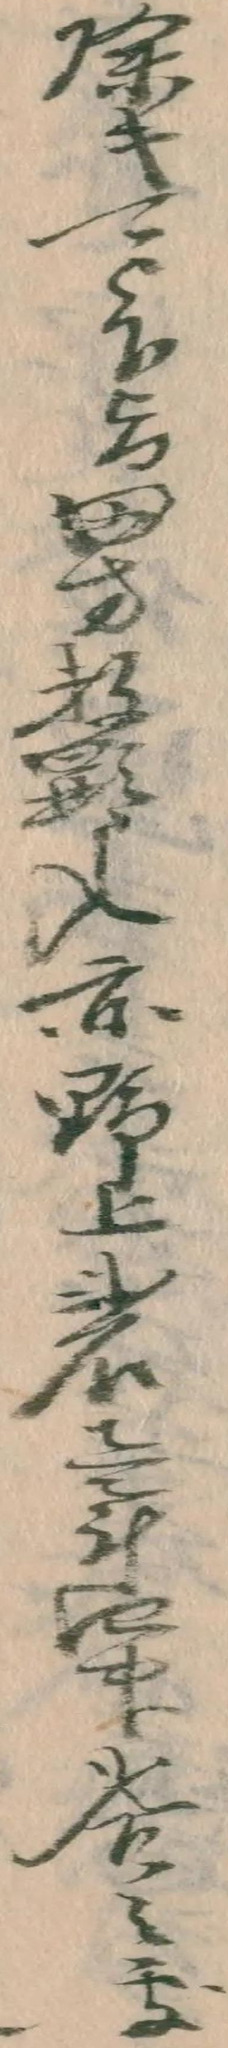除キ可被下旨田方数顕申入亦野上弐石壱斗四升弐合之處
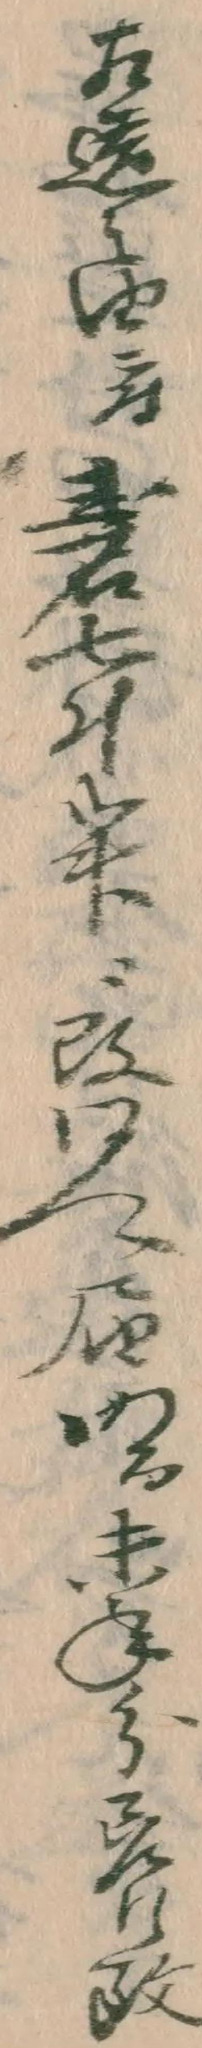相違之由ニ付弐石七斗弐升ニ改同人へ届仍而未年分差引致
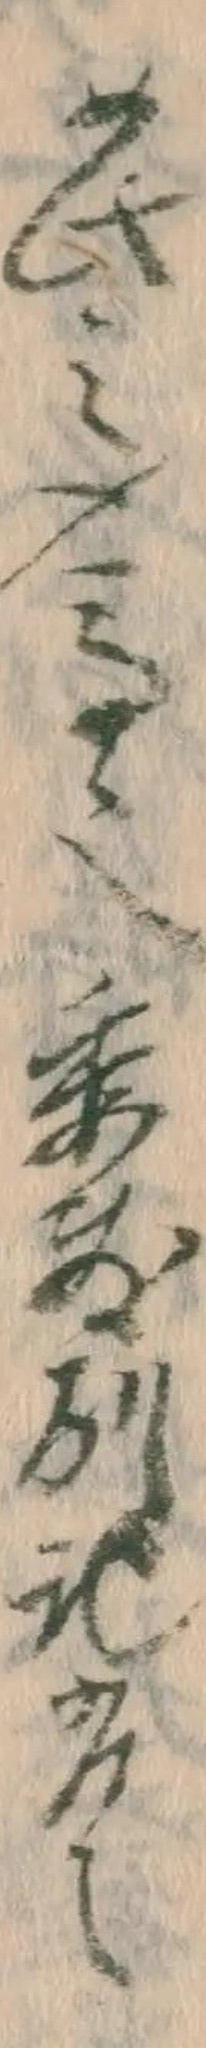如此之〆高也委敷別記有之
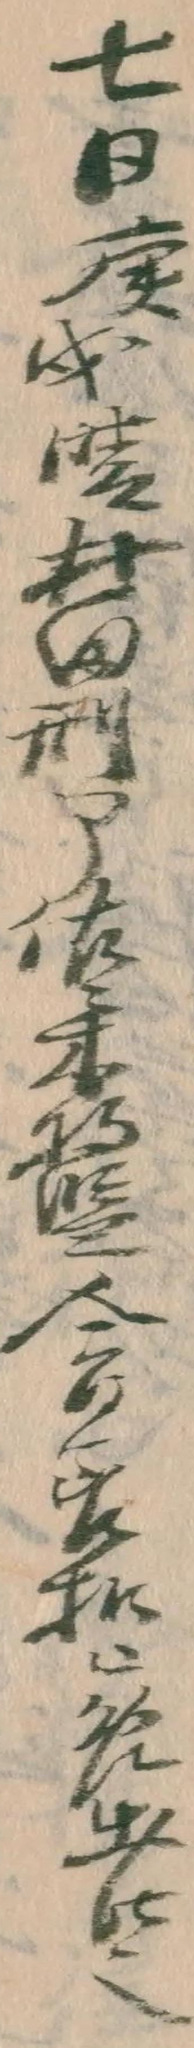七日庚戌晴村田刑部佐々木将監今日差扣被被免出仕也
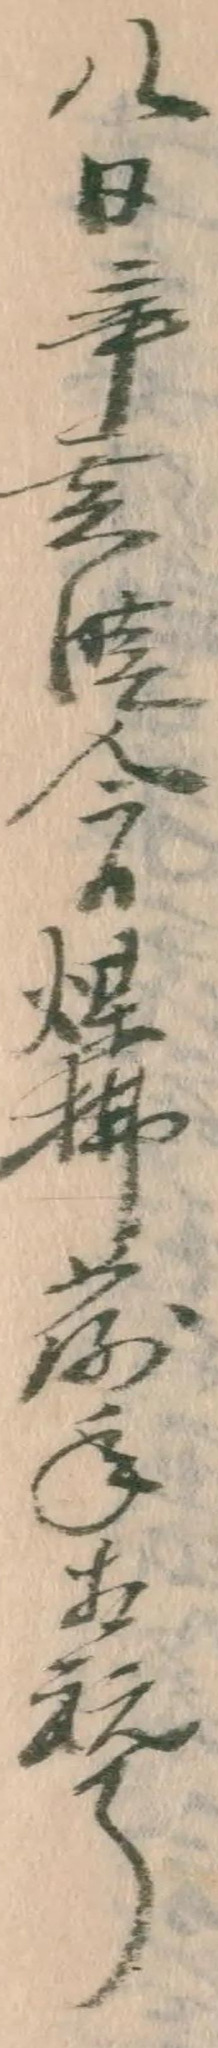八日辛亥晴今日煤払如例年相祝了
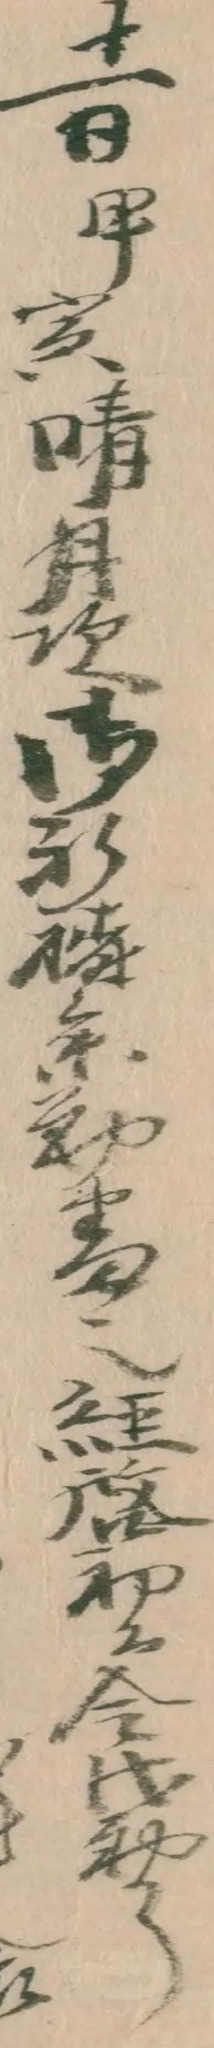十一日甲寅晴月次御祈祷参勤番也経啓初而令代勤了
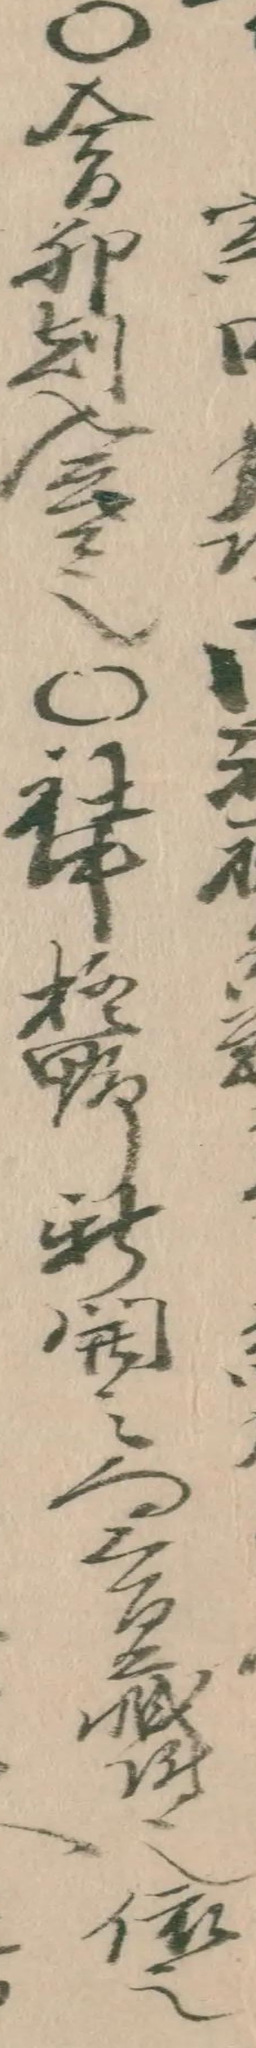○今日卯刻入置也○社中柊野新開之向今日蔵附也依之
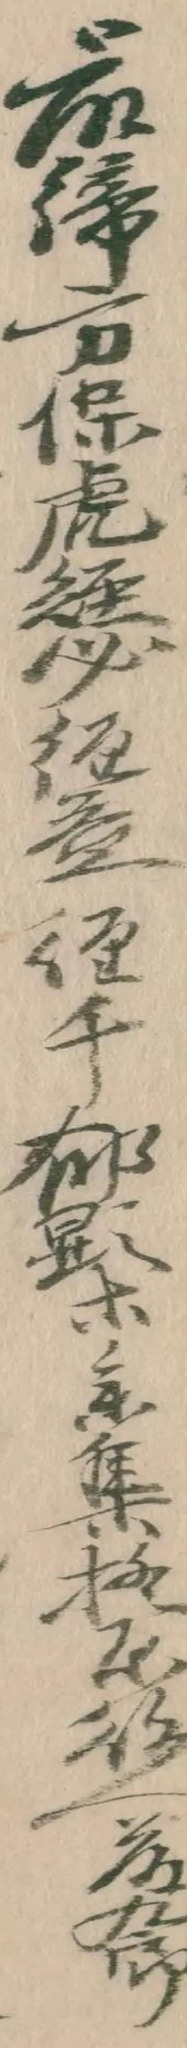御取締方保虎経必経益経千郁顕等参集柊原役人藤九郎
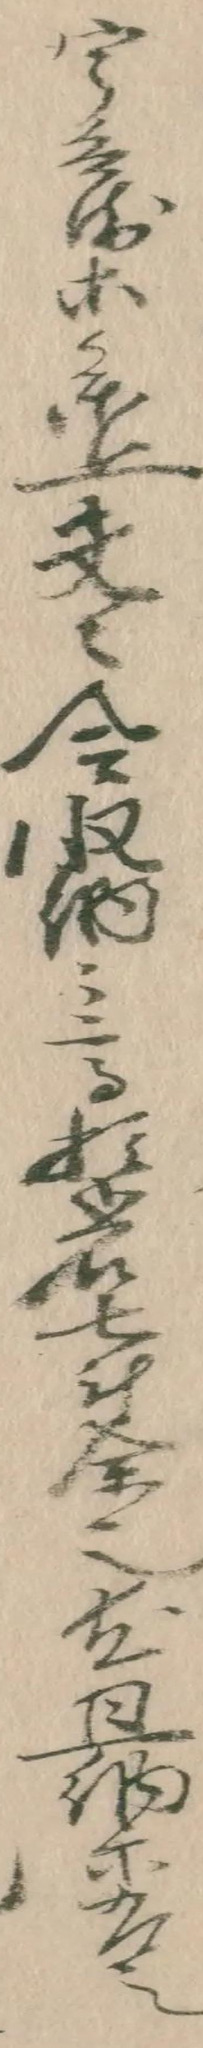宇兵衛等参上夫々令収納之高拾弐石七斗余也尤且納等有之
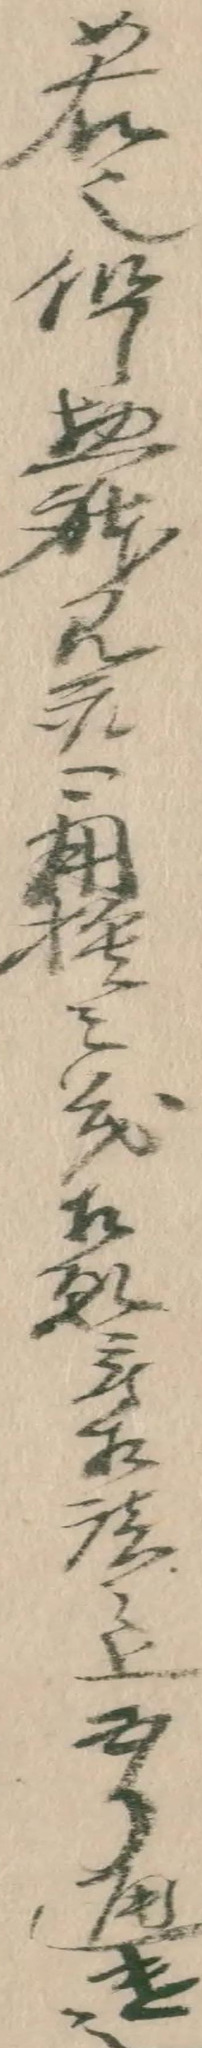如右也但し惣躰見取御用捨之義相願ニ付相談之上五月通遣也
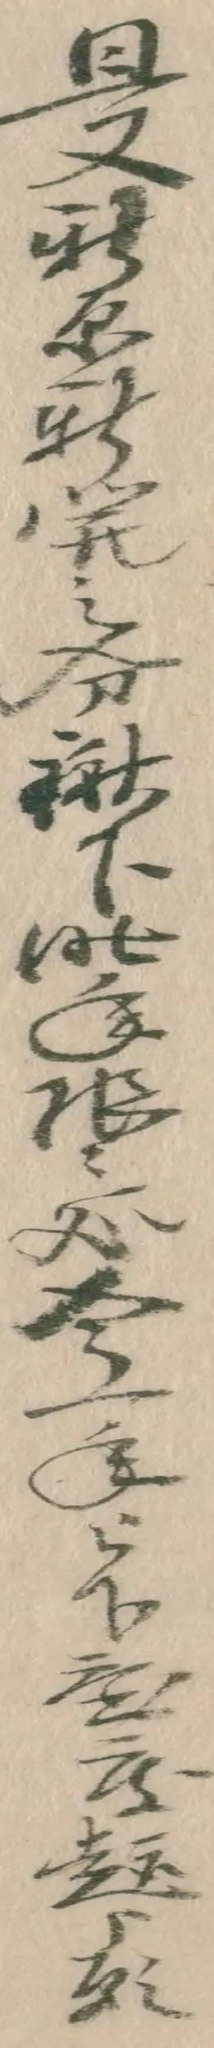且又新原新開之分鍬下昨年限之処今一年被下置度趣申願
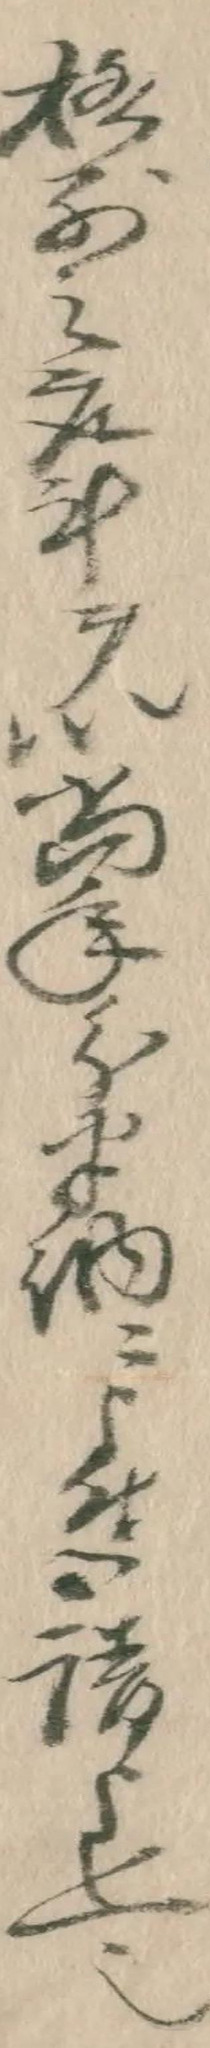格別之取斗を以當年分半納ニ申付御請申上也
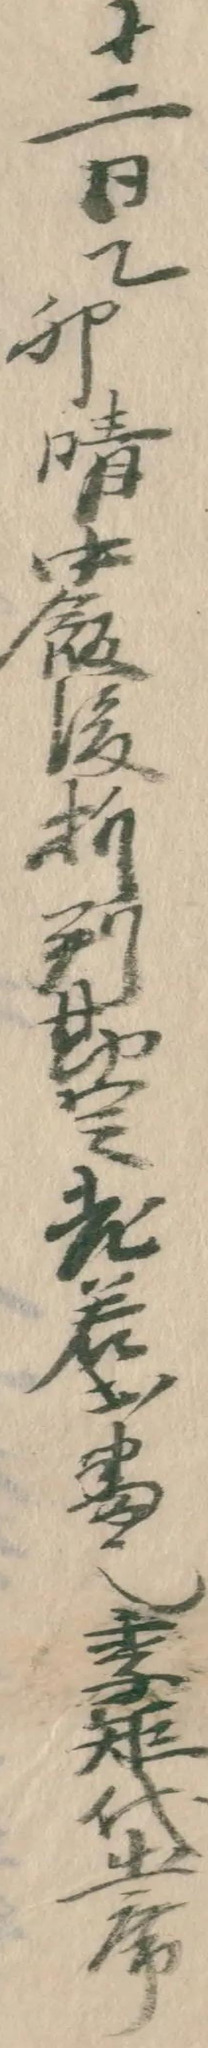十二日乙卯晴中飯後折判勘定老若出番也季矩代出席
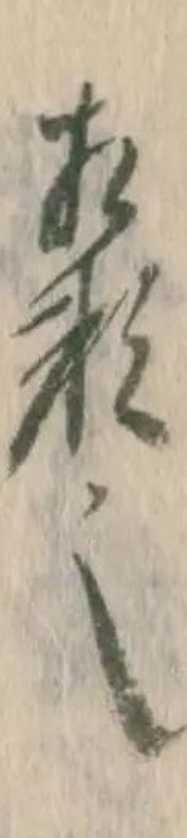相頼也
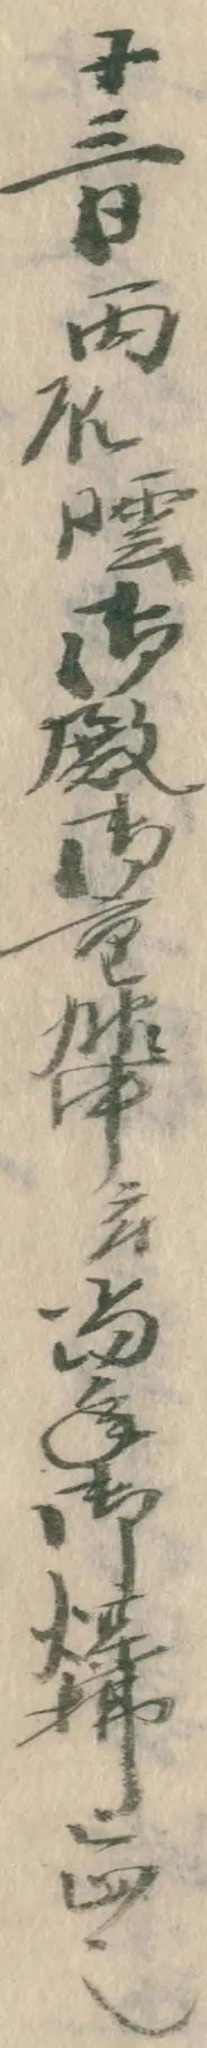十三日丙辰曇御殿御重服中ニ付當年御煤払被止也
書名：賀茂社記録. 第67冊
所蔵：国立国会図書館 National Diet Library, JAPAN
